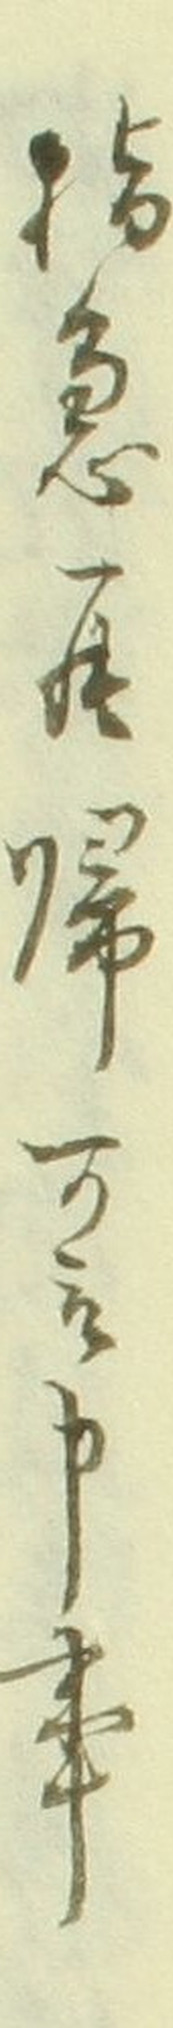指急罷帰可被申事
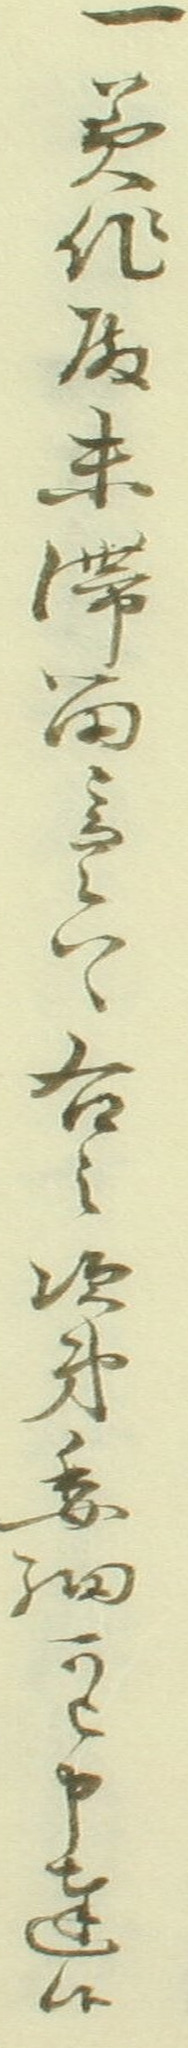一美作殿未滞留に而候はゝ右之次第委細可被申達候
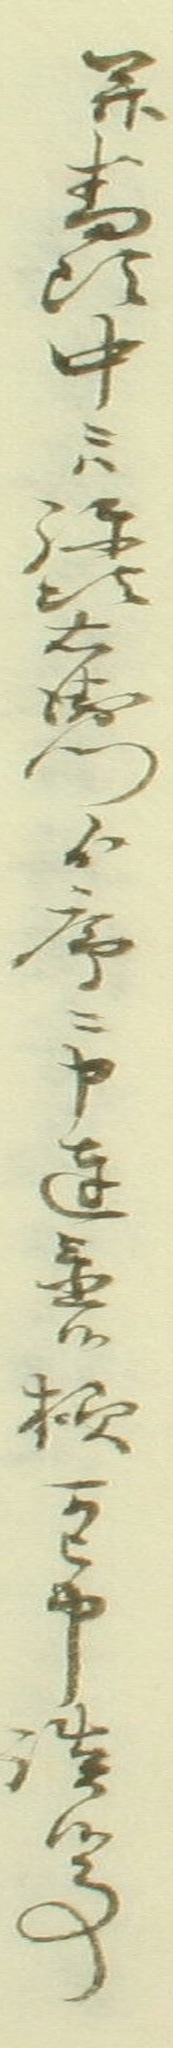塀番頭中には弥次右衛門ゟ序に申達置候様可被申談候事
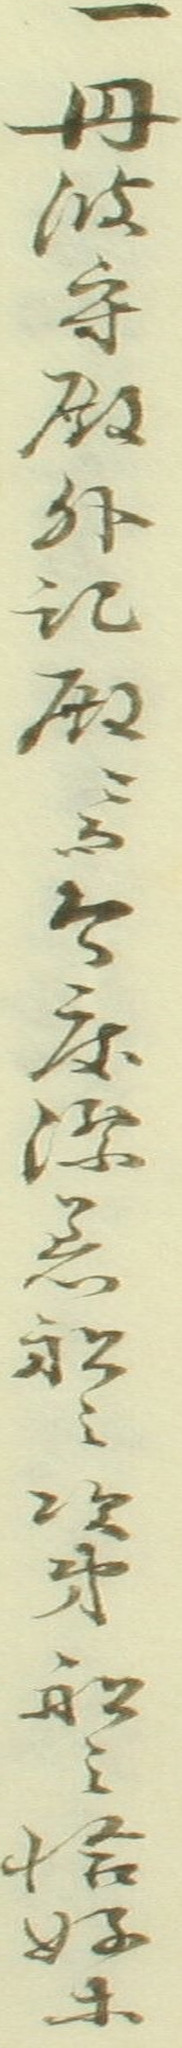一丹波守殿外記殿に而今度漂着船之次第船之恰好等
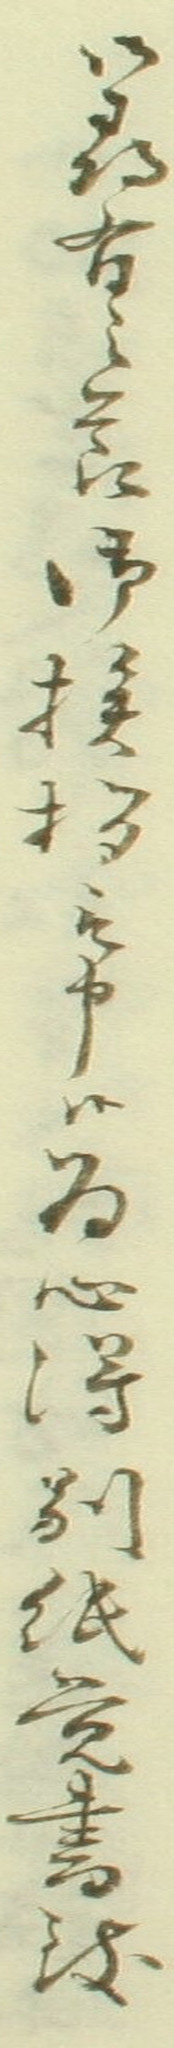御尋有之節御挨拶被申候為心得別紙覚書致
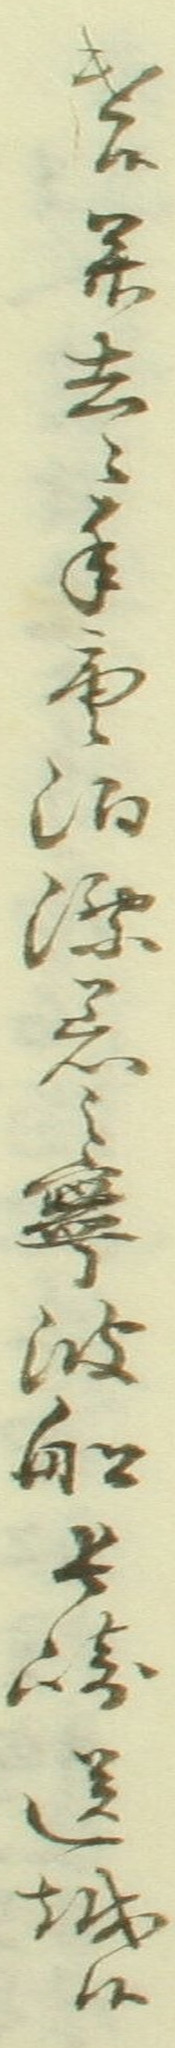遣候并去々年唐泊漂着之寧波船長崎送越候
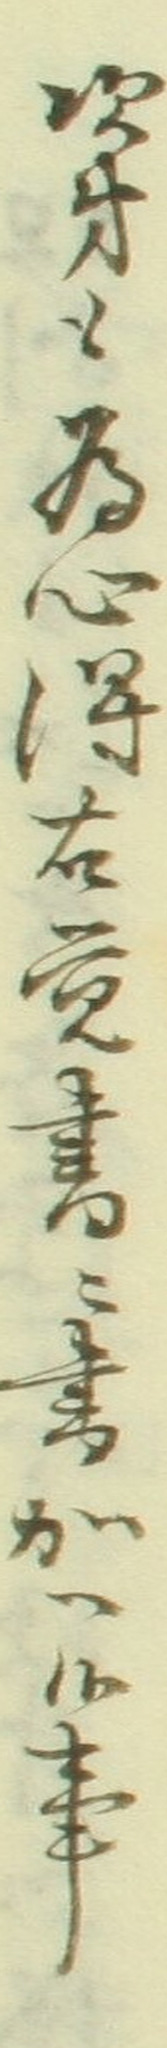次第も為心得右覚書に書加へ候事

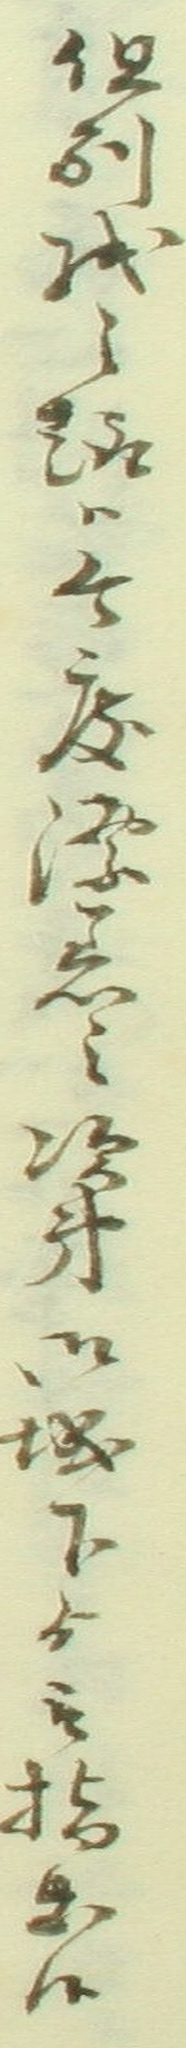但別紙之趣は今度漂着之次第御城下ゟ被指出候
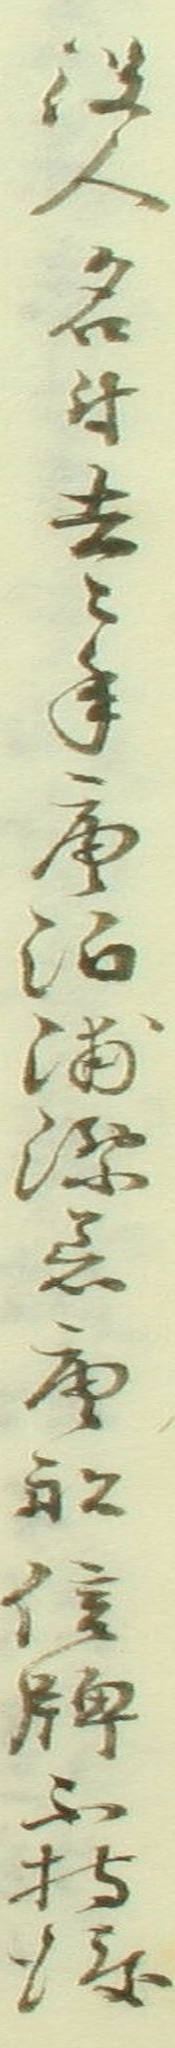役人名付去々年唐泊浦漂着唐船信牌不持渡
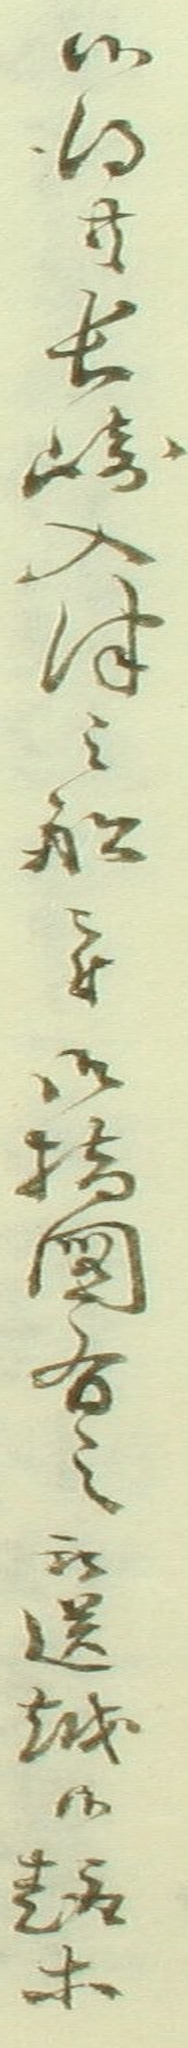候得共長崎入津之船に付御指図各々被送越候趣等
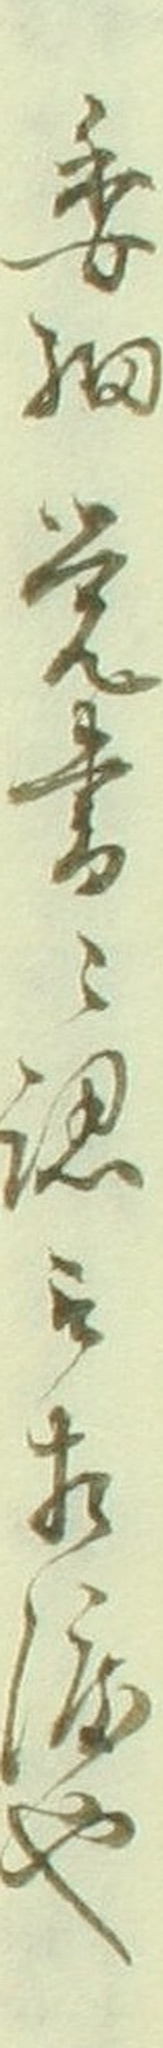委細覚書に認被相渡也
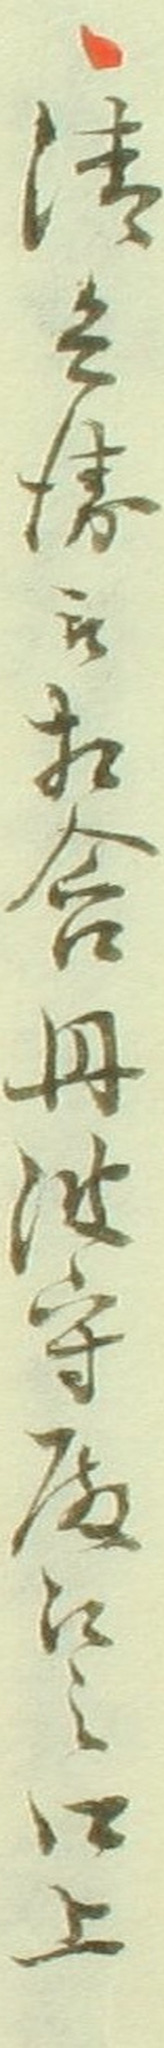清兵衛被相含丹波守殿え之口上
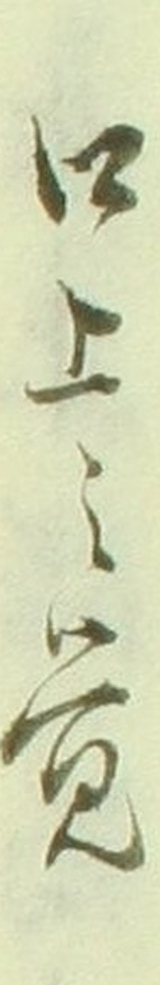口上之覚
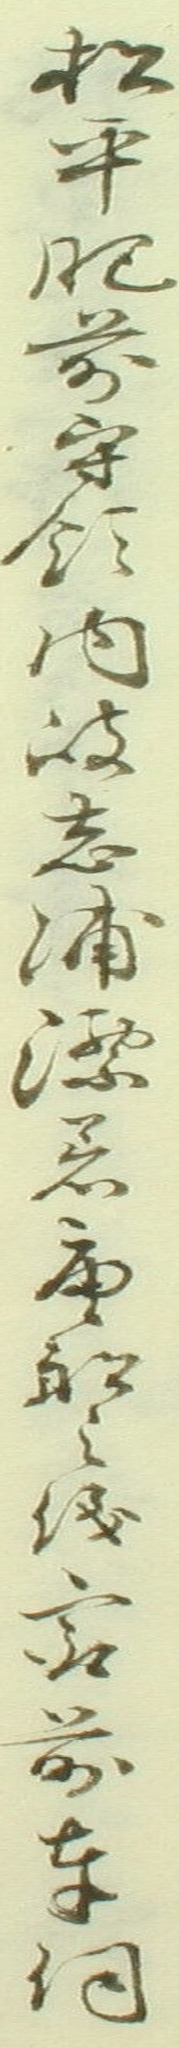松平肥前守領内岐志浦漂着唐船之儀最前奉伺
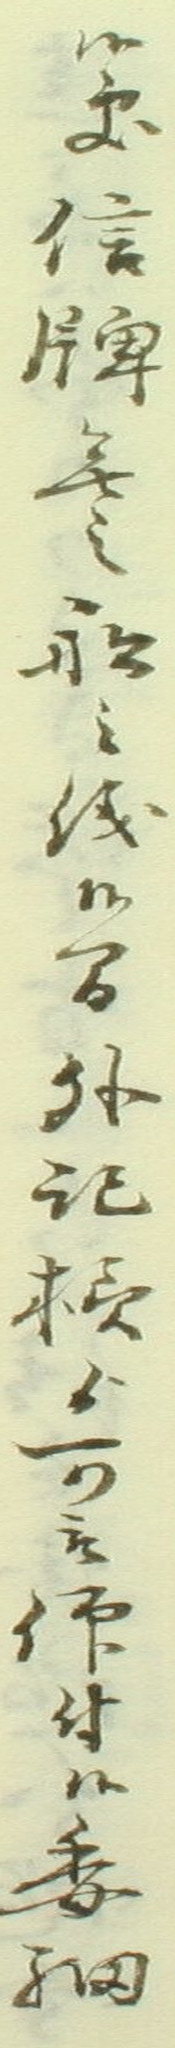候処信牌無之船之儀候間外記様ゟ可被仰付候委細
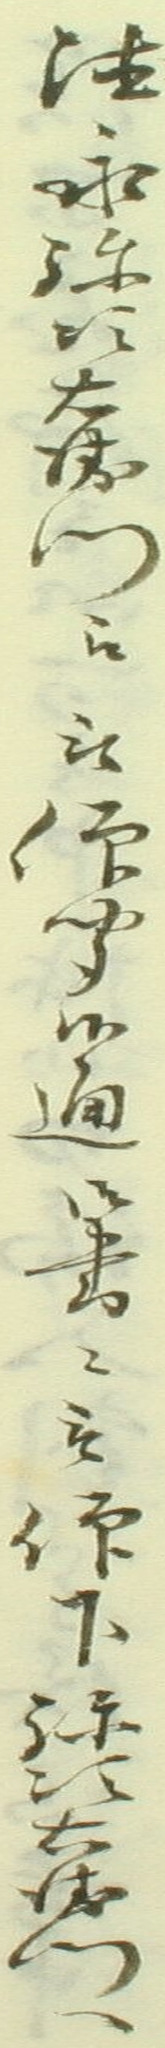徳永弥次右衛門え被仰聞候通御書に被仰下弥次右衛門へ
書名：異国船漂着記
